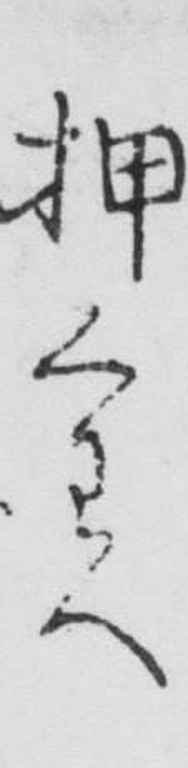押くわへ
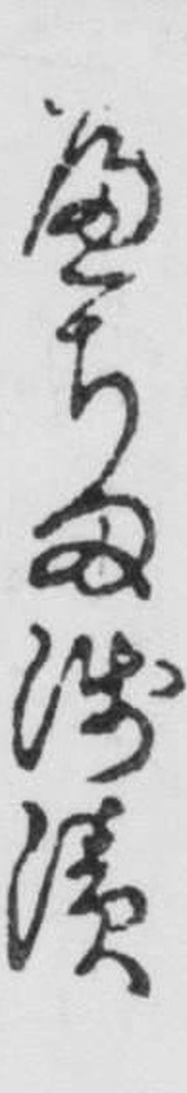へちま浅漬
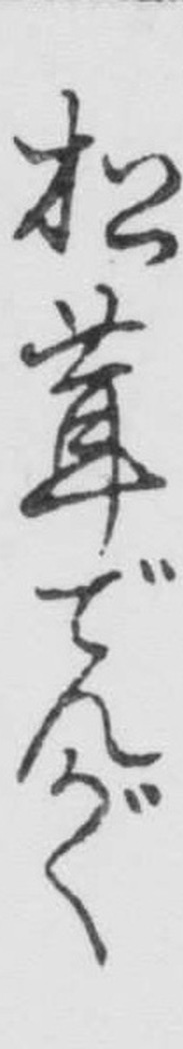松茸でんがく
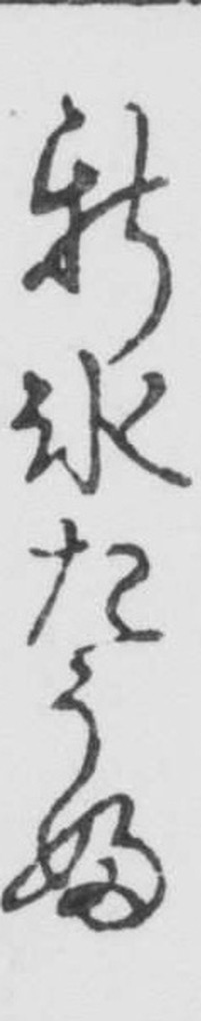新氷たうふ
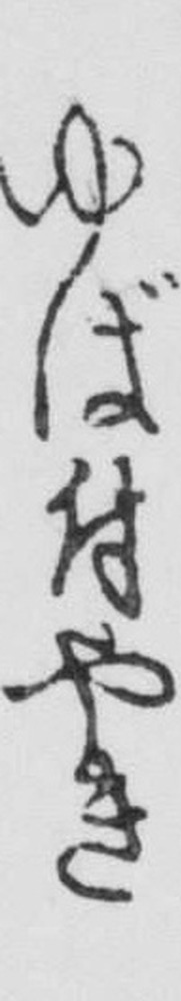ゆば付やき
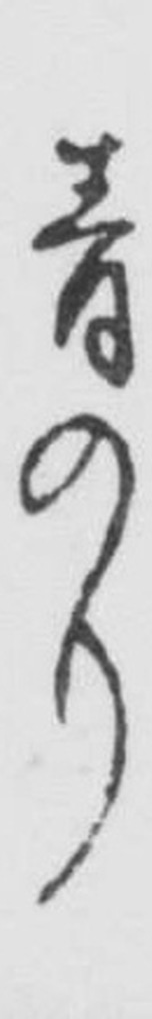青のり
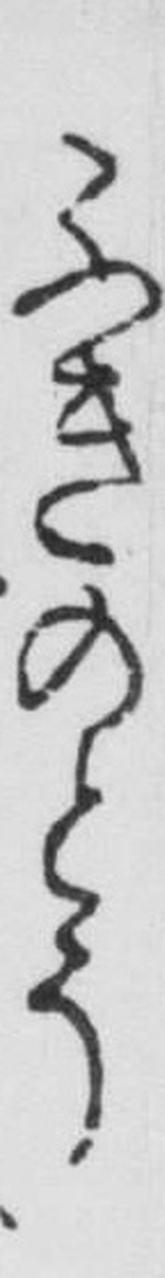ふきのとう
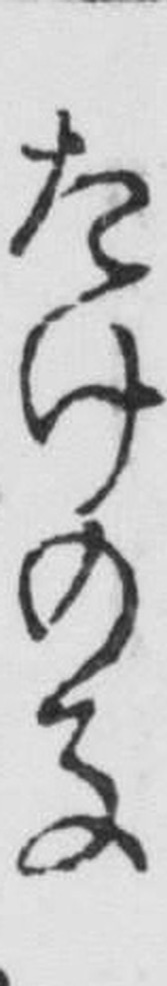たけの子
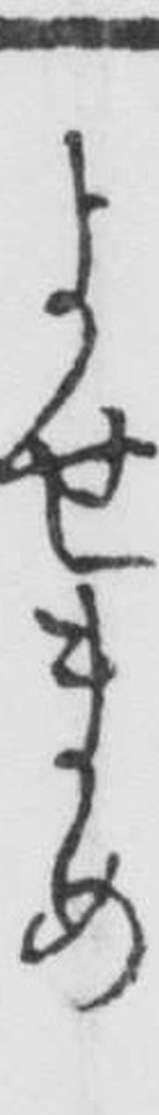よせまめ
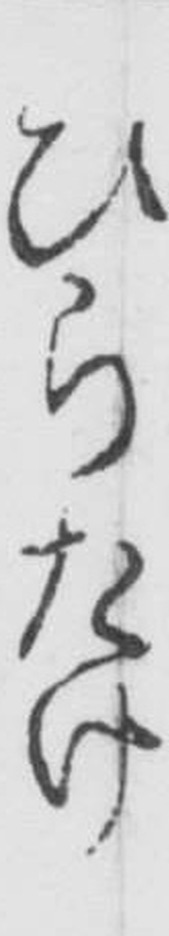ひらたけ
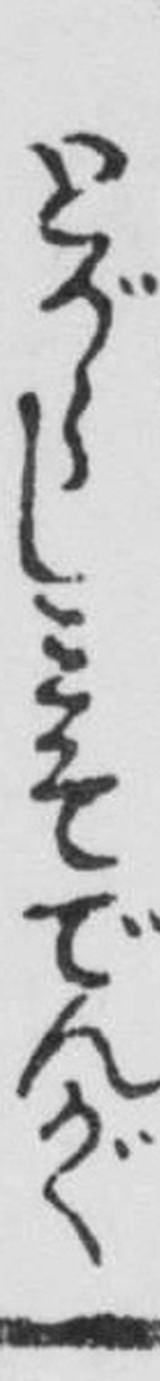とがらしみそでんがく
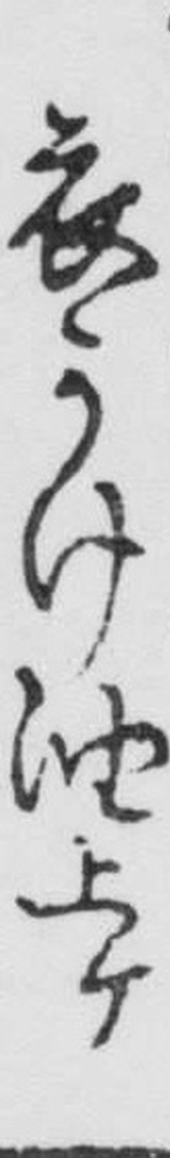衣かけ油上け
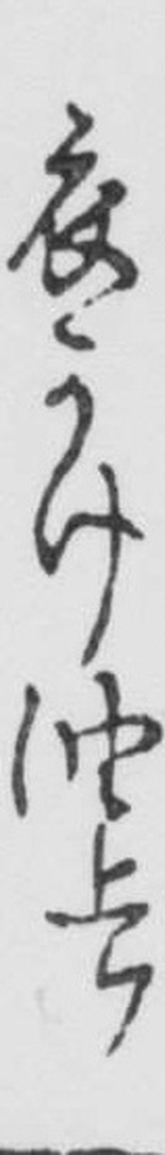衣かけ油上け
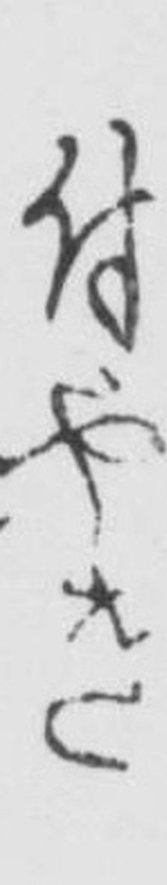付やき
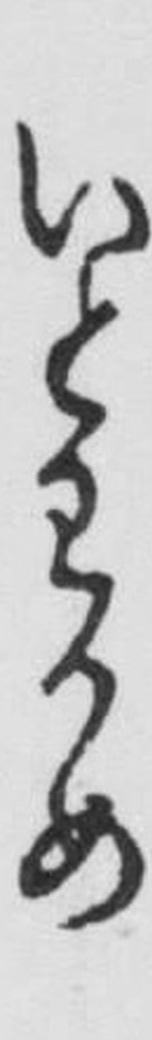いとわかめ
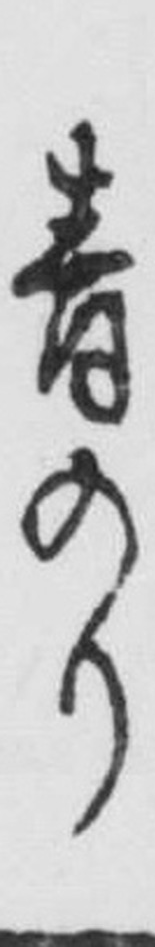青のり
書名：諸家通用/即席料理
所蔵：大阪府立大学学術情報センター 国文学研究資料館
